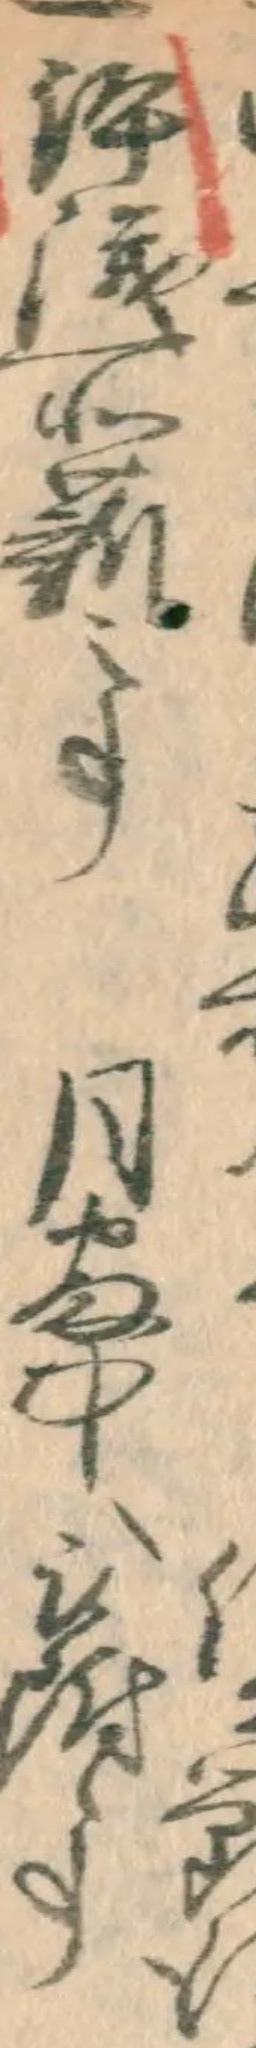一評議所薪之事月番中へ被付候事
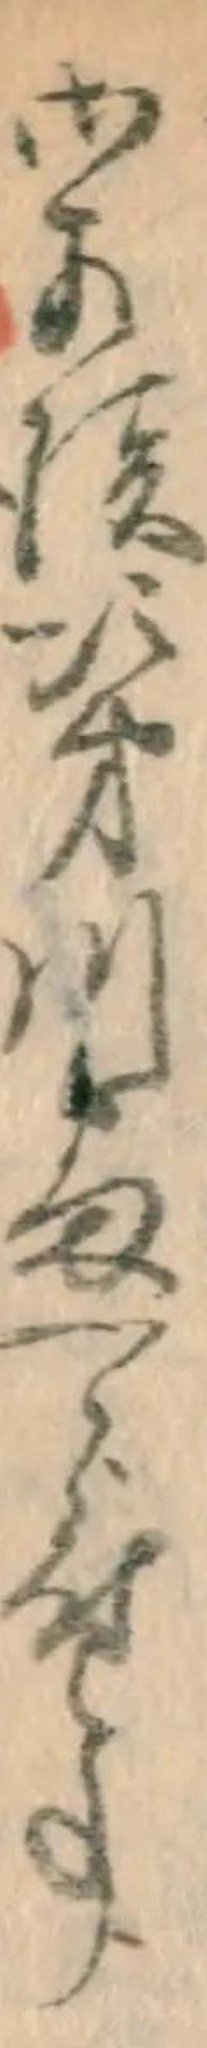御相談次第川番可被付候事
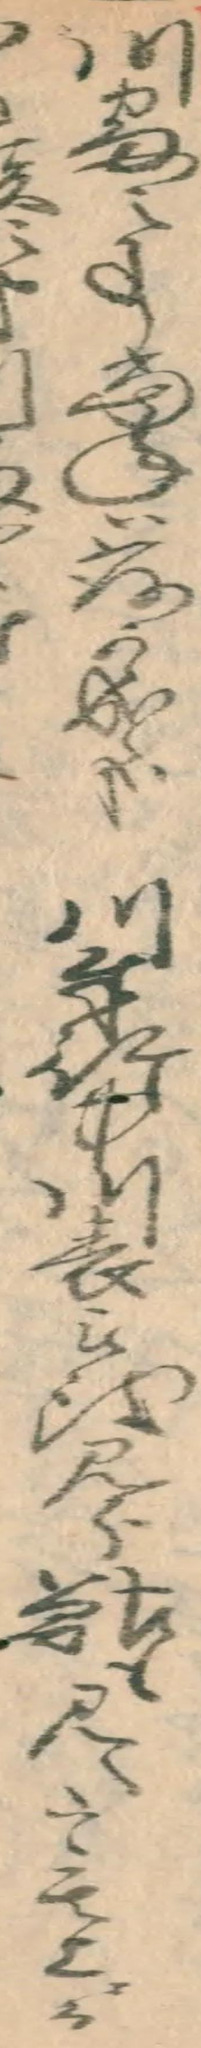一川番之事当年ハ如何可成候哉川奉行中川表被致見分鮎も見へ候ハヽ其上ニ而
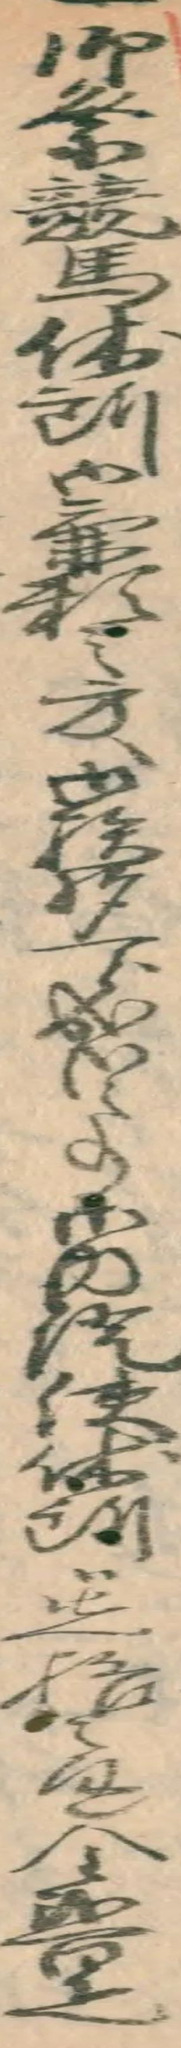一御祭競馬休所御兼頼之方へ御挨拶上可被成哉之事御内証使休所ハ先格之通金弐百疋
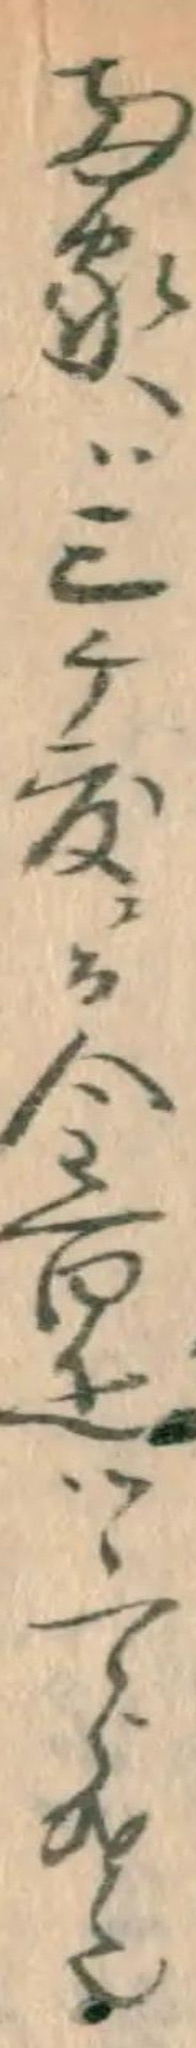両家へハ三ヶ度ニ而金百疋ツヽ可被遣也
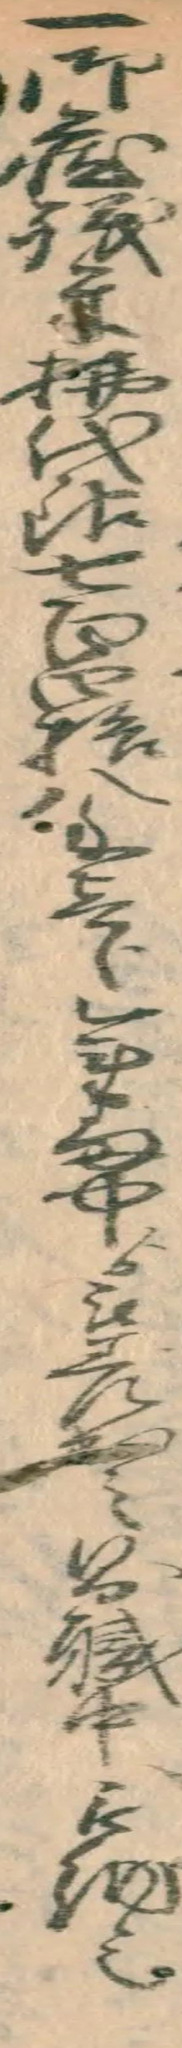一御蔵残米払代銀七百四拾八匁壱歩年番中ゟ被差出之則職中へ被納候也
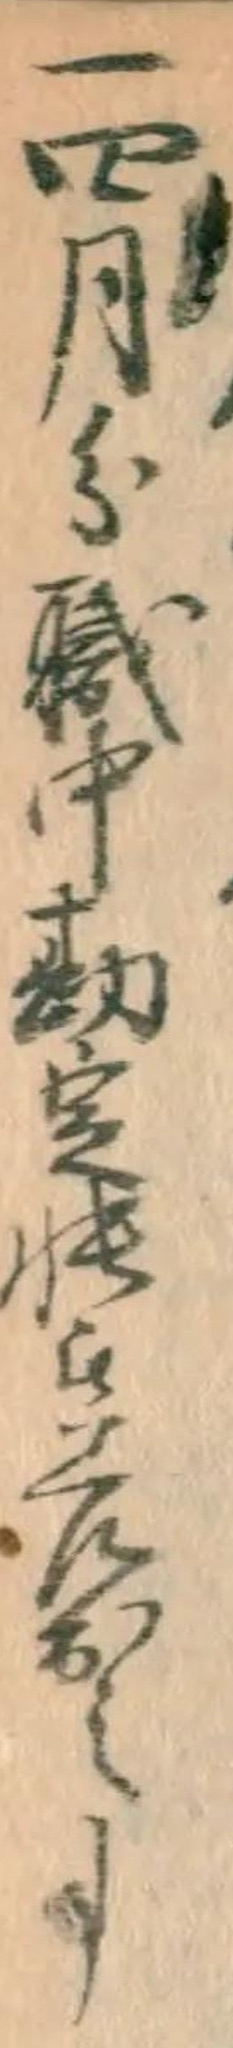一四月分職中勘定帳被差出之事
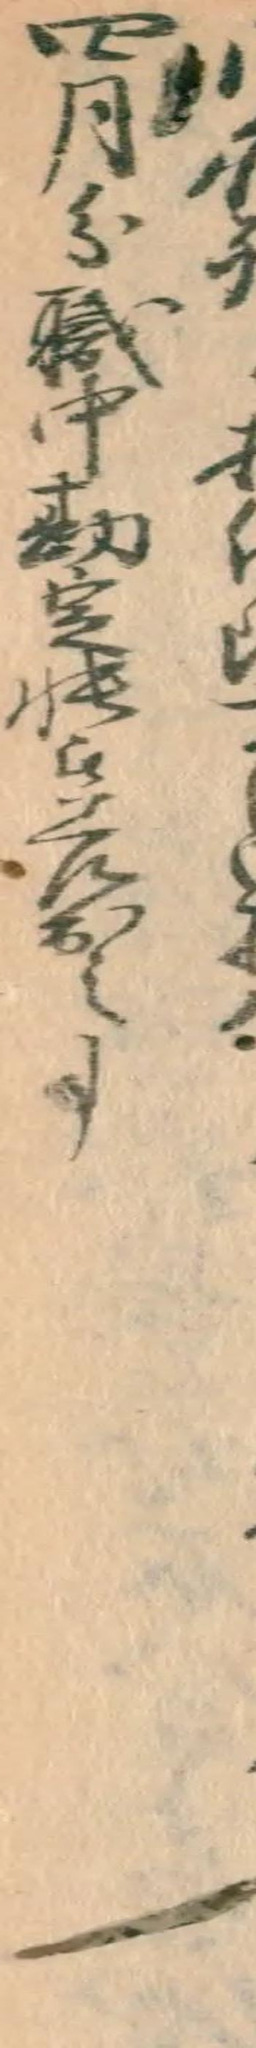一四月分職中勘定帳被差出之事
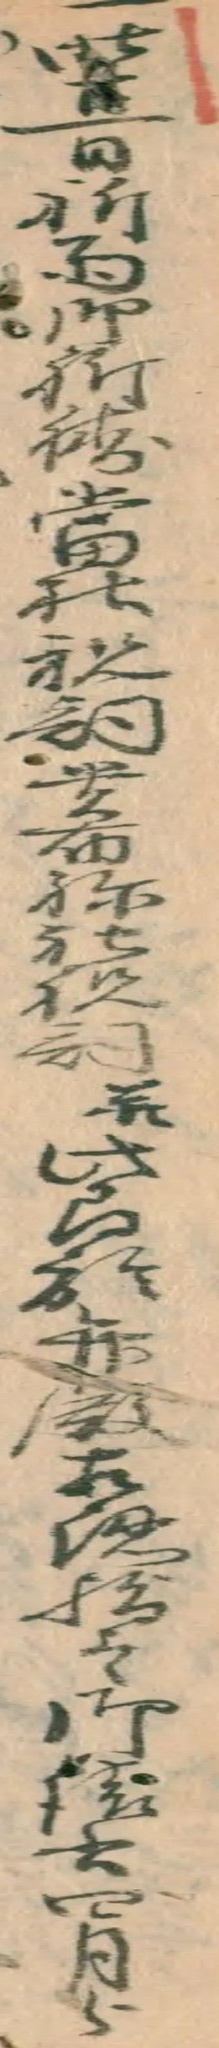一昨廿一日祈雨御祈祷当社祝詞貴布祢社祝詞并此間於弁殿相認指上候御請書四月分
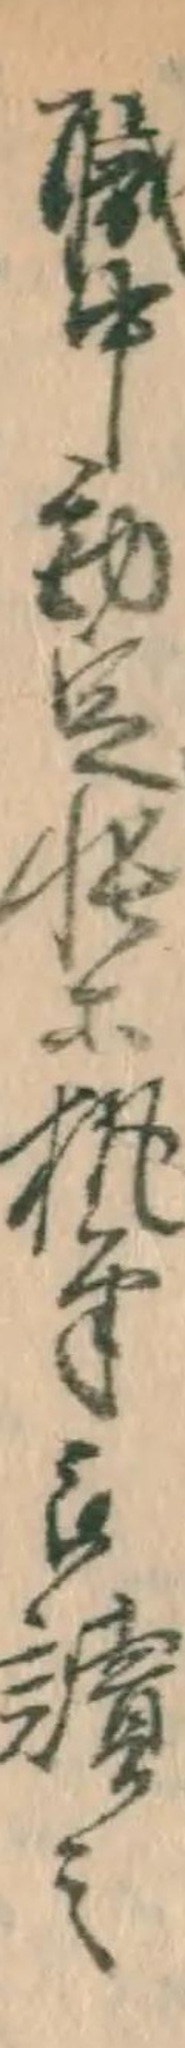職中勘定帳等執筆被読之
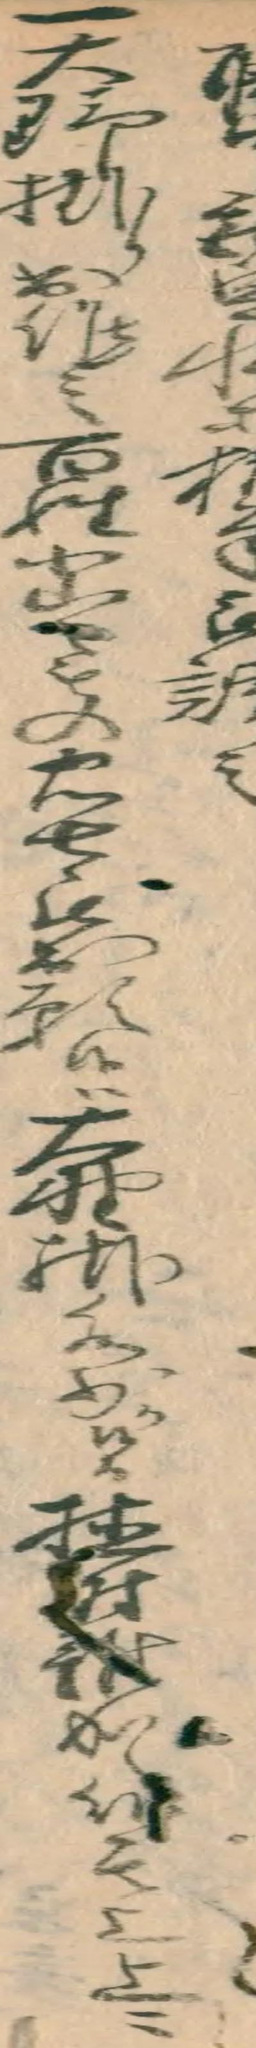一大野掛り出作之百姓小山之もの忠七罷出願候ハ大野掛水少ク候而植付難成候処其上上ニ
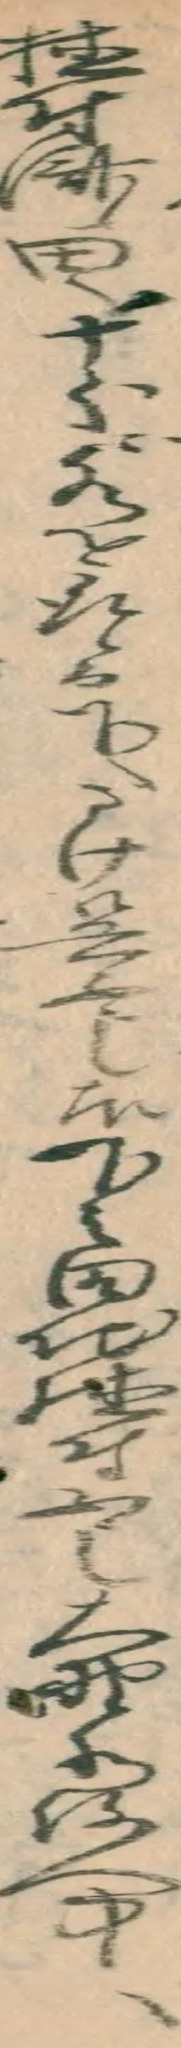植付済候田へ十分ニ水を取候而下へさけ呉不申候故下之田地植付不申候大野水役人中へ
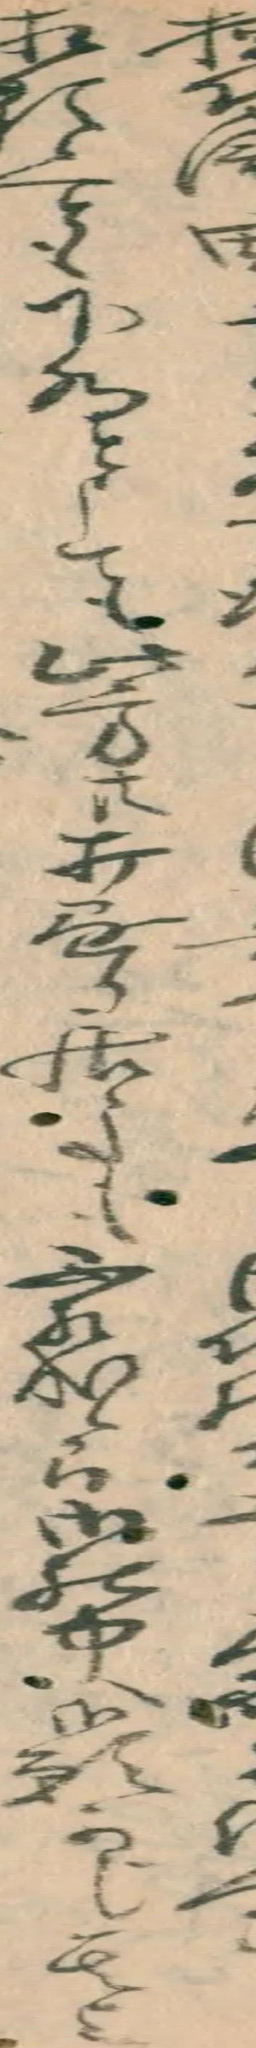相頼候へとも下水と申ても此方共打懸り居候事も不相成候間御社中へ御願可申候其上
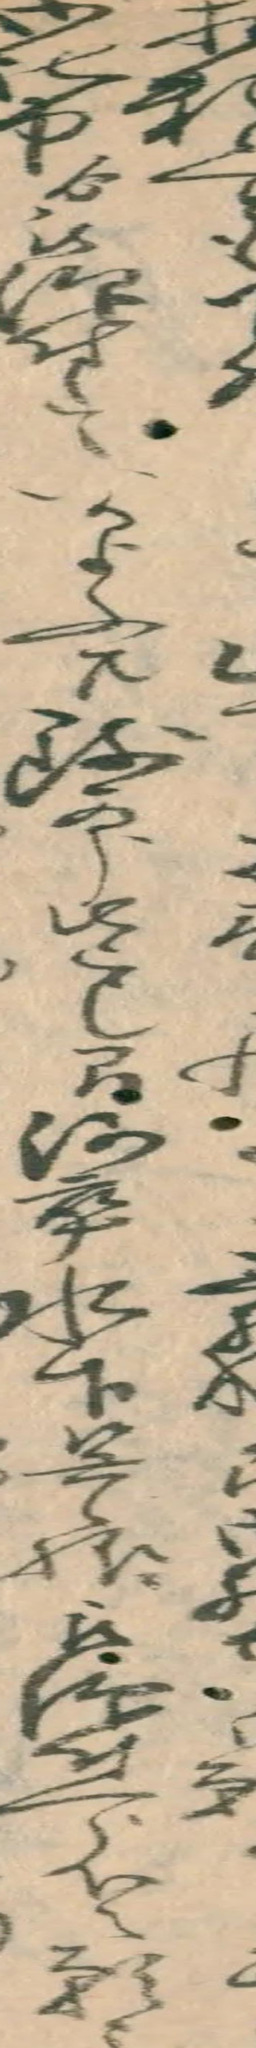御社中ゟ被仰付候ハヽいかよふ共致可申由被申候間何卒水下呉候様ニ被仰付可被下候願也
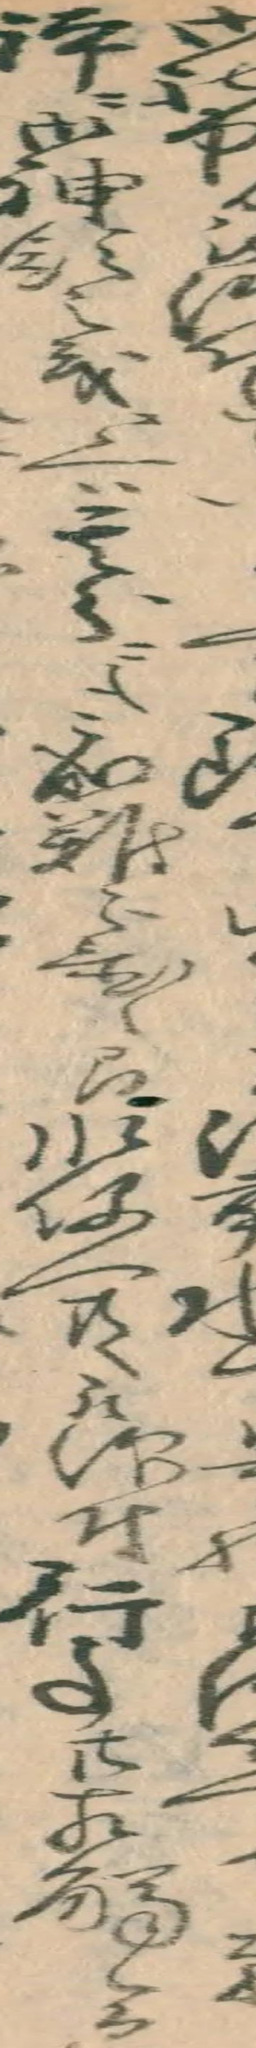評ニ御神領之義ニ候ヘハ其分ニも被成難被置候間水役人共へ被仰付行事共相触候而
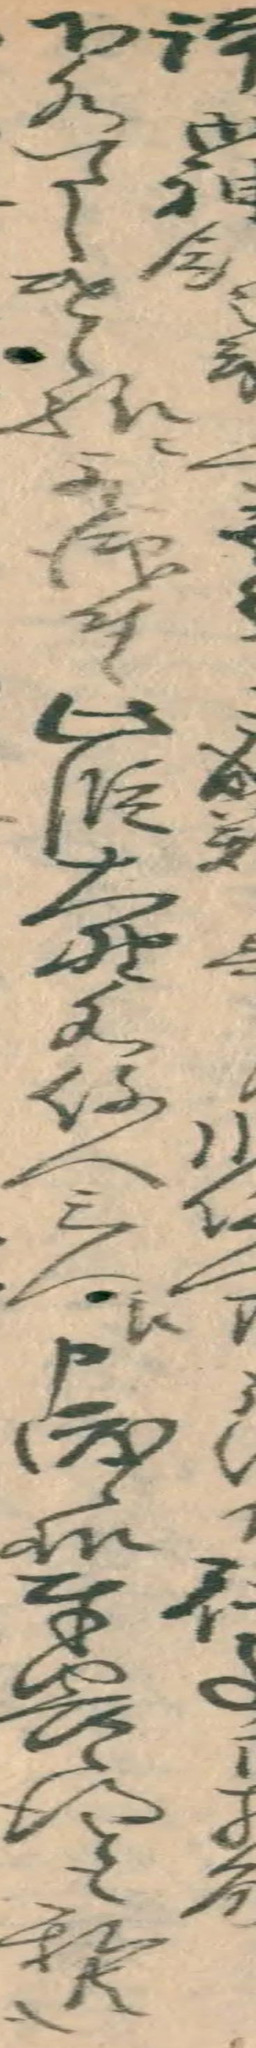下水いたし遣候様ニ可被仰付候此段大野水役人三人江申渡候処奉畏候得とも私共も
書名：賀茂社記録. 第58冊
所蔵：国立国会図書館 National Diet Library, JAPAN
